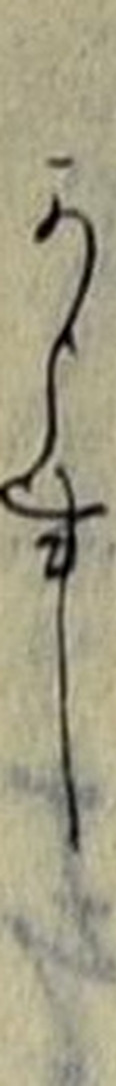可申事
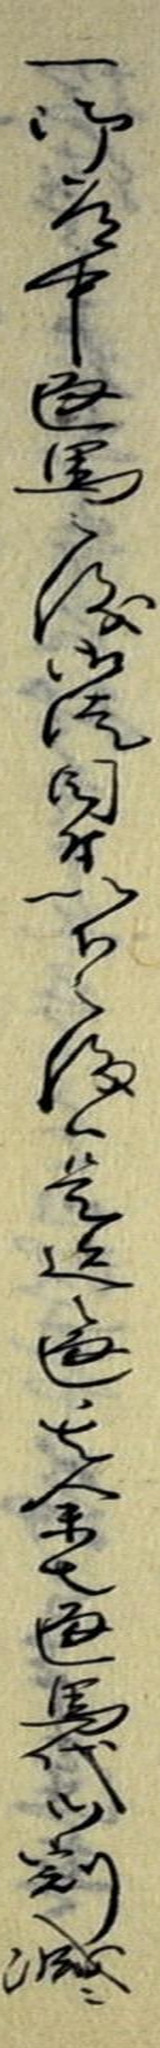一御道中返馬之儀御徒目付以下之儀は是迄之通其余は通馬代御割減に
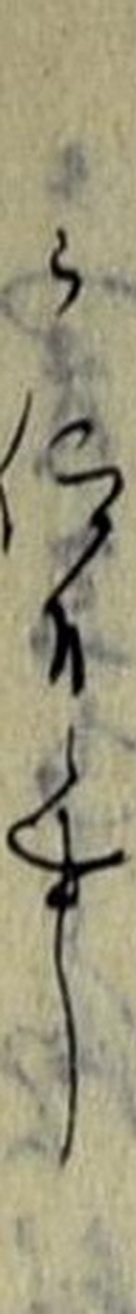被仰付候事
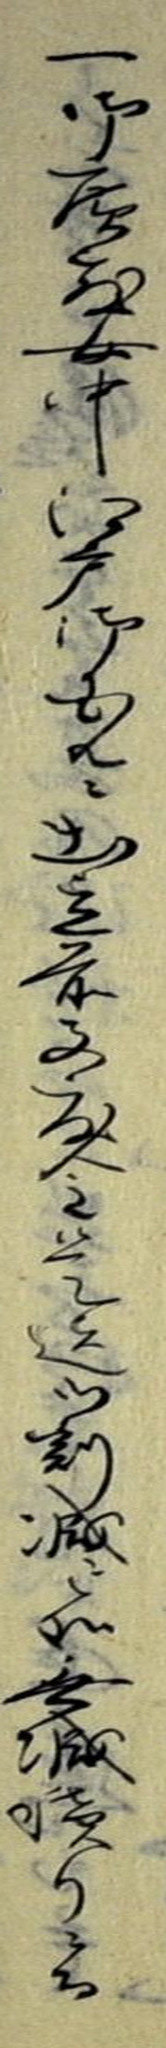一御広敷女中江戸御国元に出立前支度金是迄弐割減に候処無減積りに而
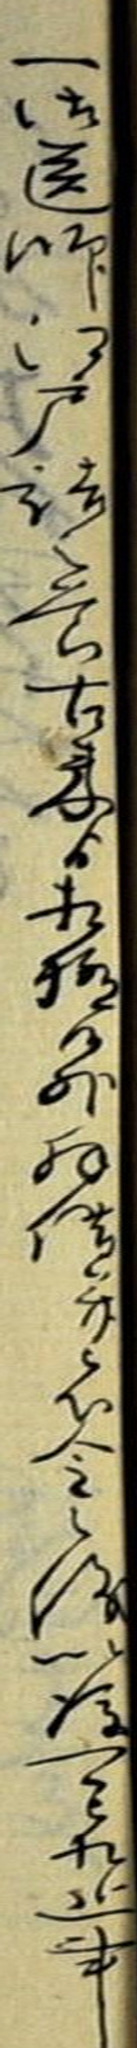一御医師江戸詰之節古来ゟ相極候外拝借并被下金之儀以後可被相止事
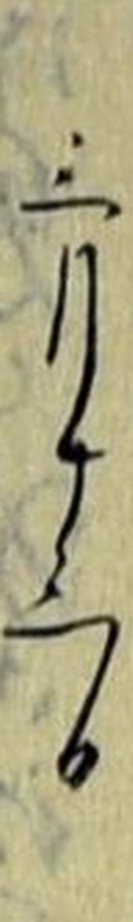三月十二日
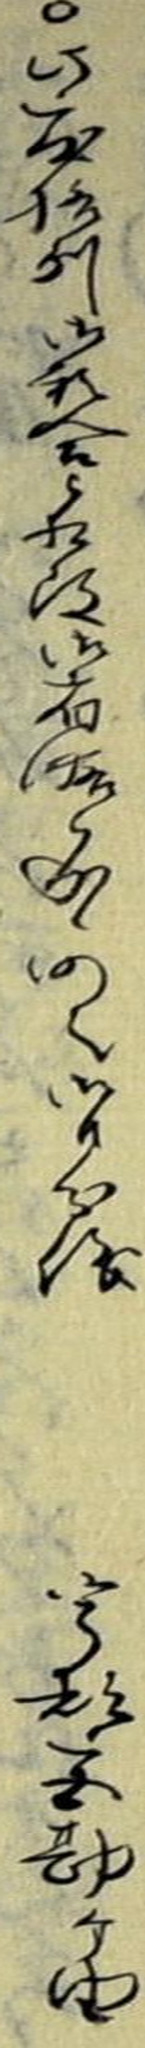〇此度格別御形合被相改御省略被成候仍之御自分儀宇都宮勘ヶ由
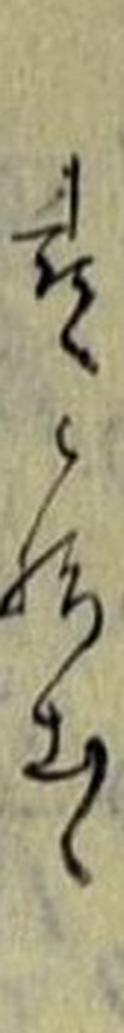表へ被指出候
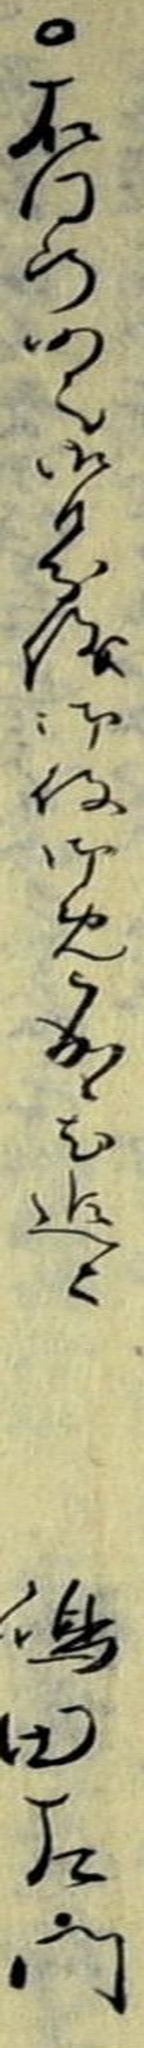〇右同断仍之御自分儀御役御免被成候尤追々嶋田左門
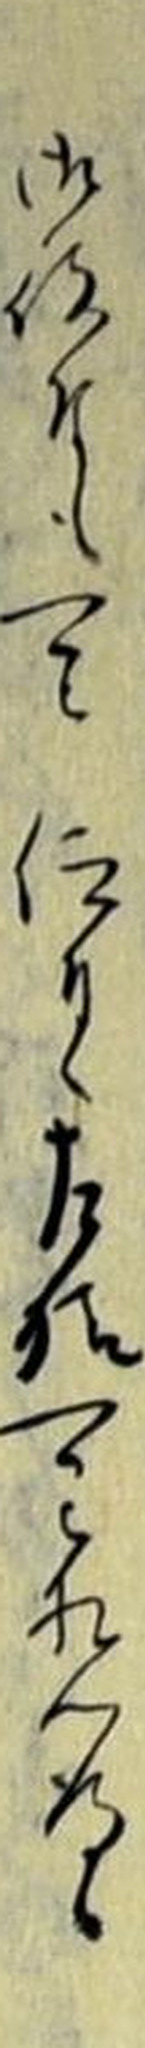御役付も可被仰付候左様可被相心得候
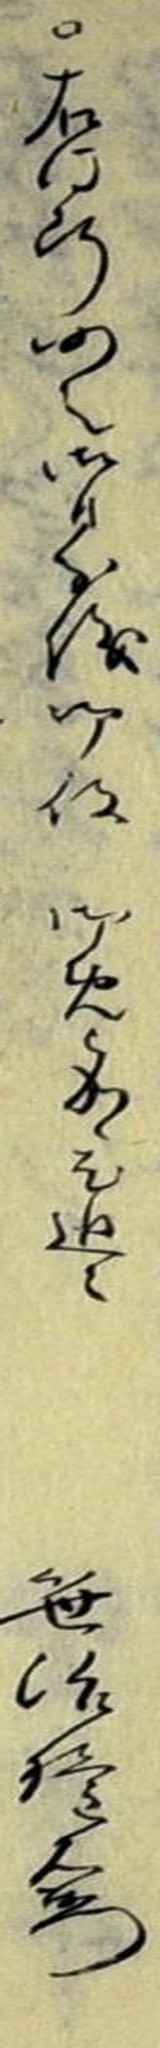〇右同断仍之御自分儀御役御免被成候尤追々笹治権右衛門
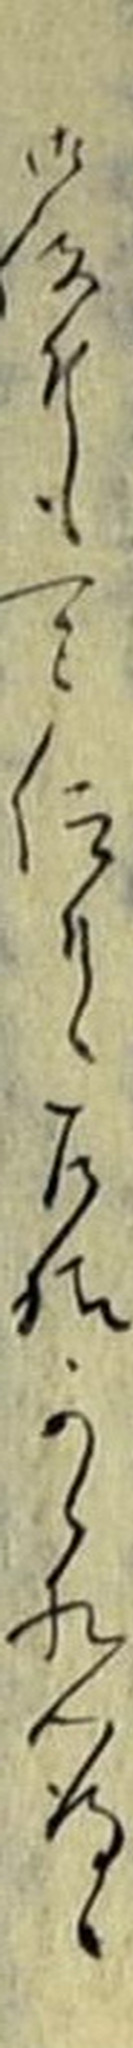御役付も可被仰付候左様可被相心得候
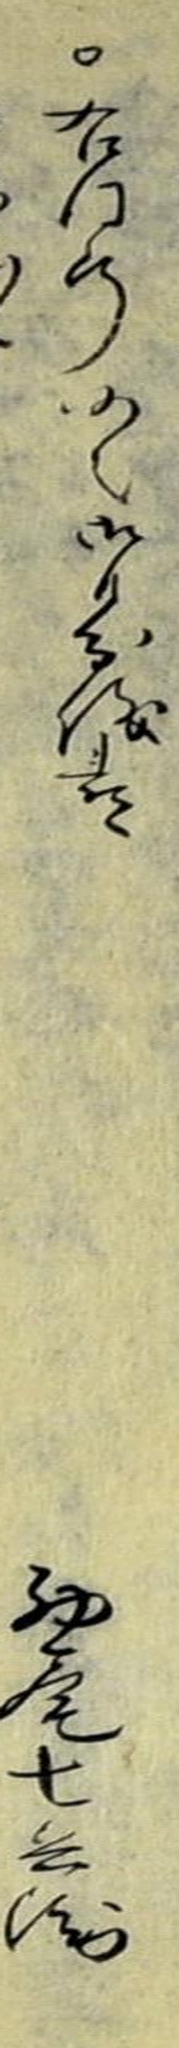〇右同断仍之御自分儀表へ西尾七兵衛
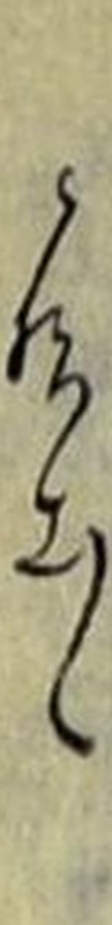被指出候
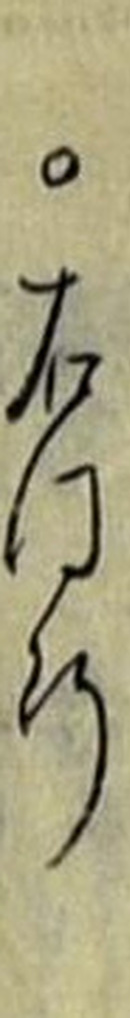〇右同断
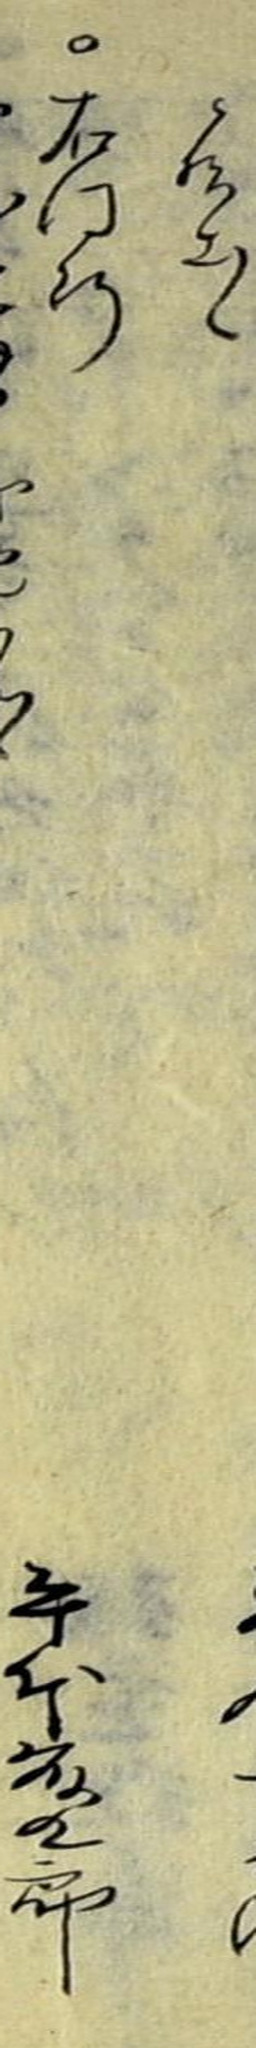御側見習御免被成候平本藤九郎
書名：命令之部 二
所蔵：福井県文書館 Fukui Prefectural Archives
